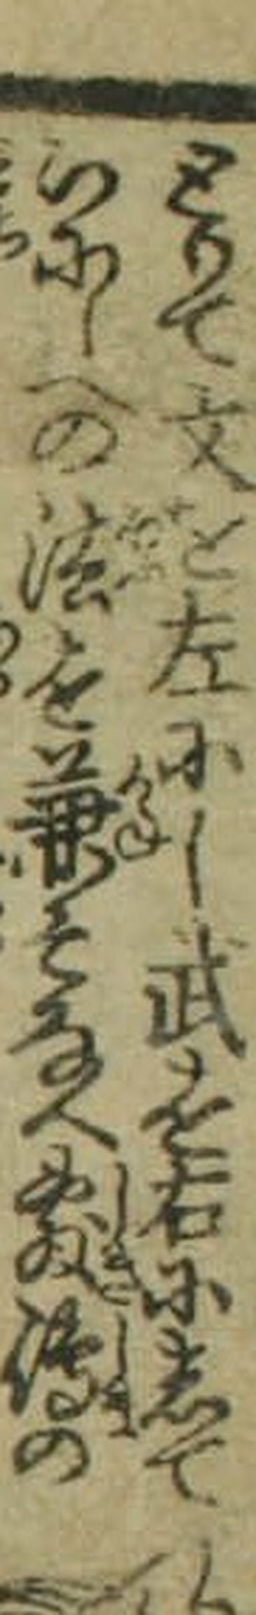いにしへの法を兼そなへ敷嶋の
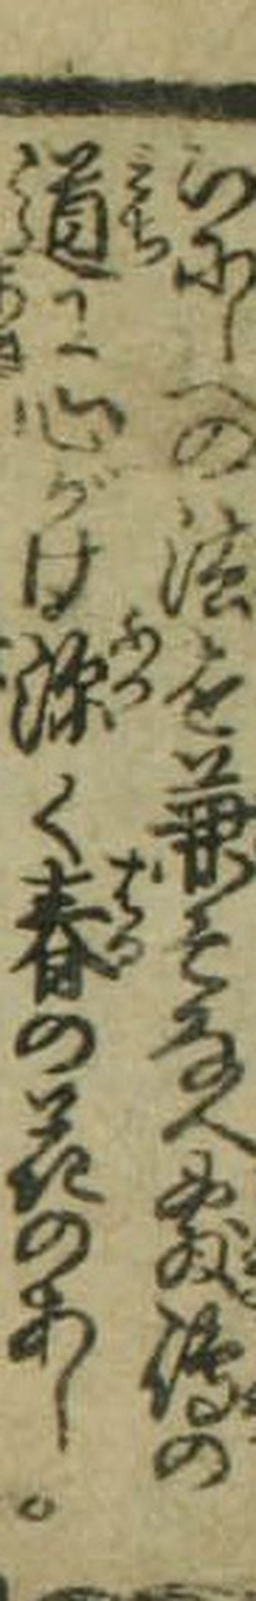道に心がけ深く春の花のあし
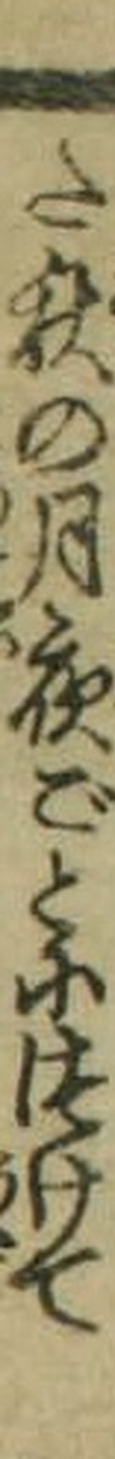た秋の月夜ごとにつけて
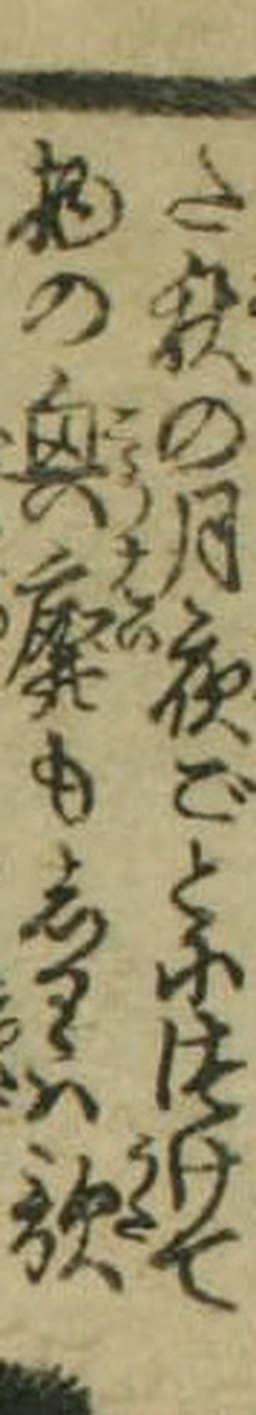物の興廃もしるゝは歌
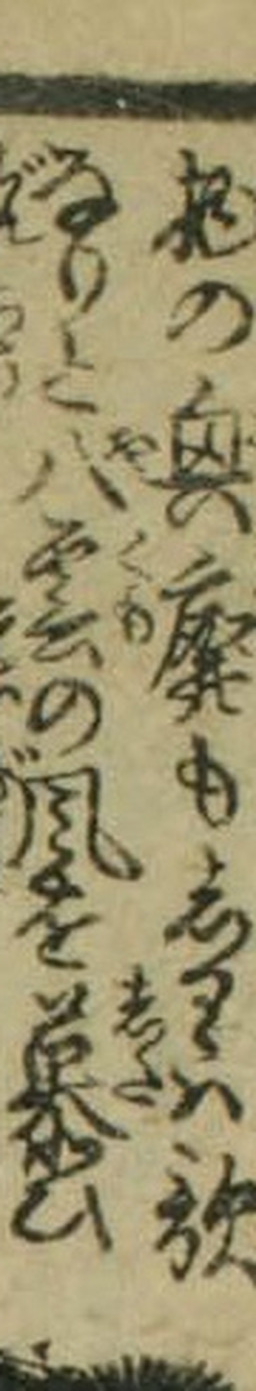なりと八雲の風を慕ひ
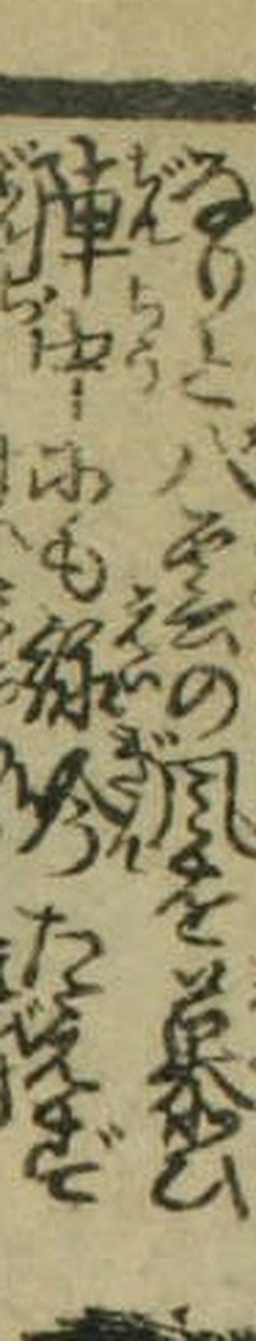陣中にも詠吟たえず
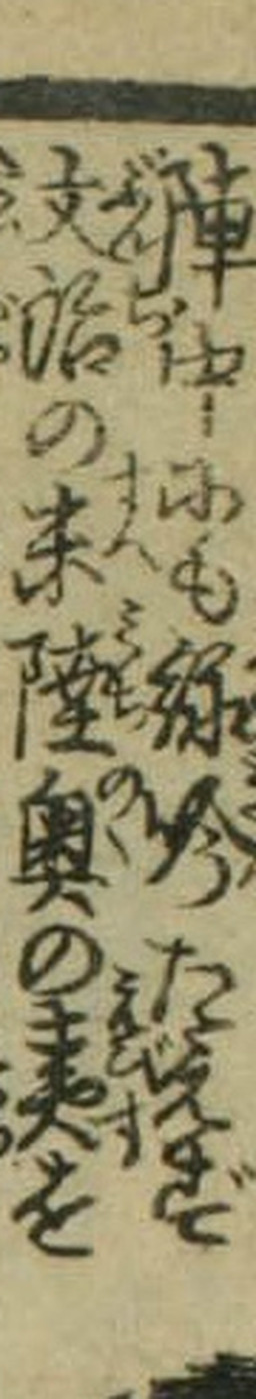文治の末陸奥の夷を
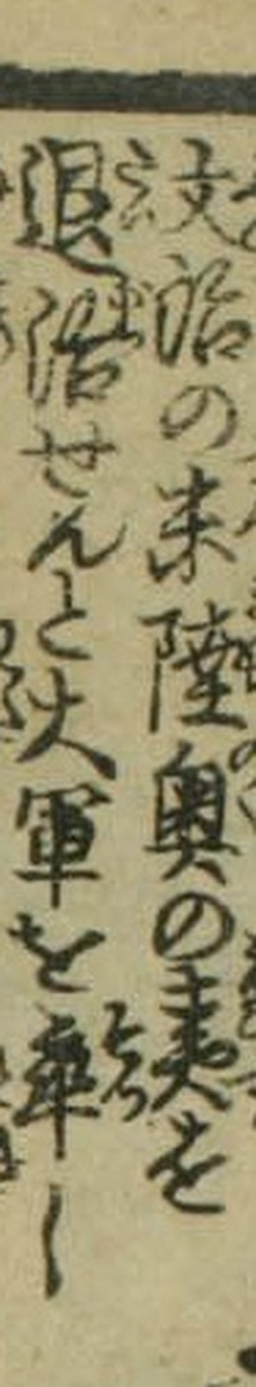退治せんと大軍を卒し
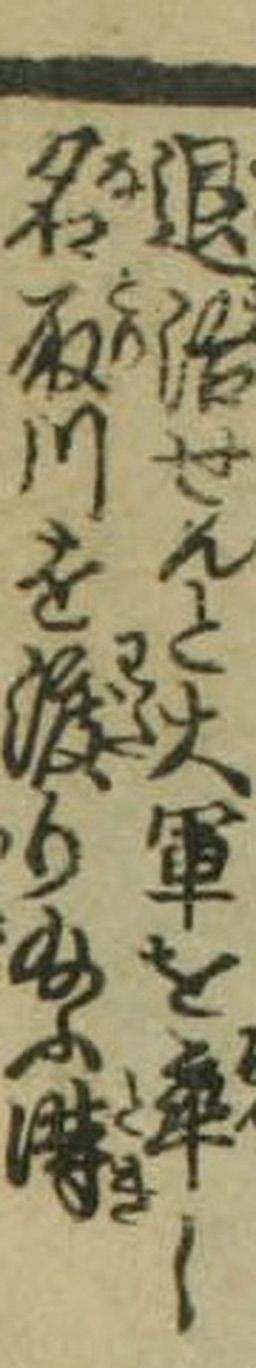名取川を渡り給ふ時
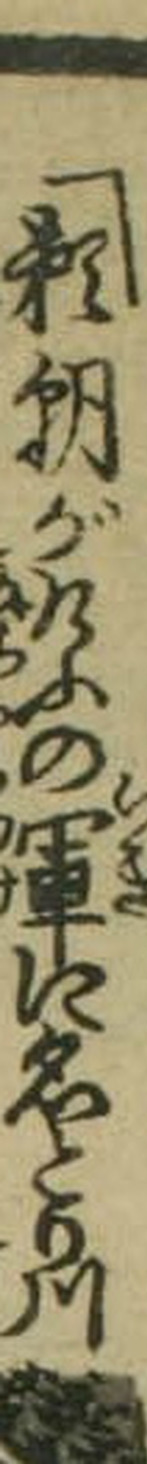〽頼朝がけふの軍に名とり川
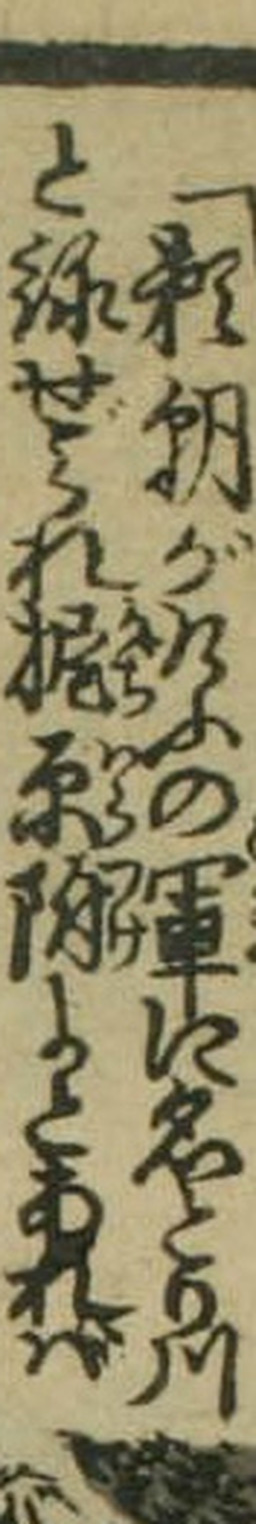と詠ぜられ梶原附にとあれば
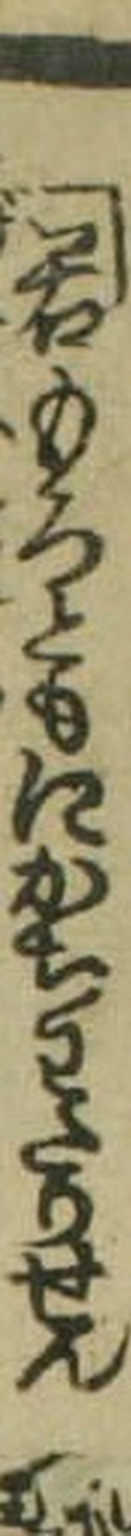〽君もろともにかちわたりせん
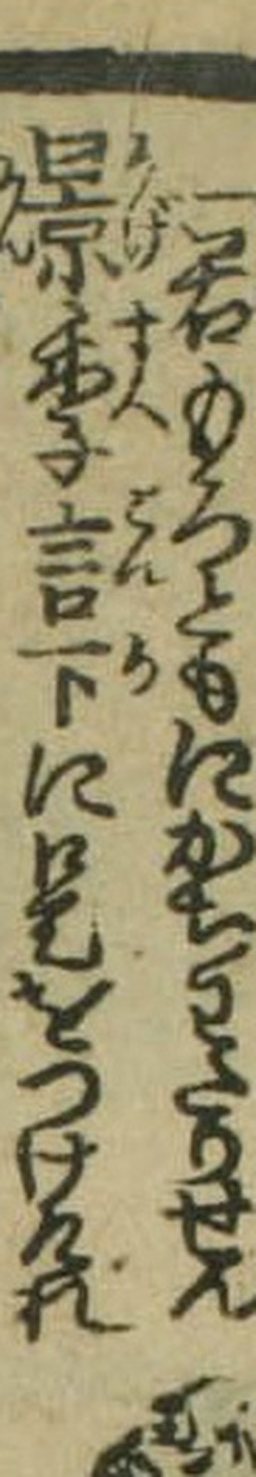景季言下に是をつけけれ
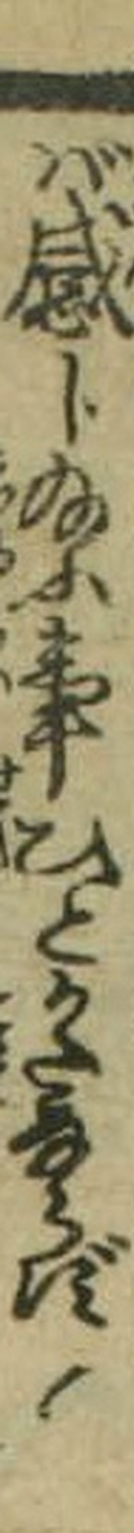ば感じ給ふ事ひとかたならず
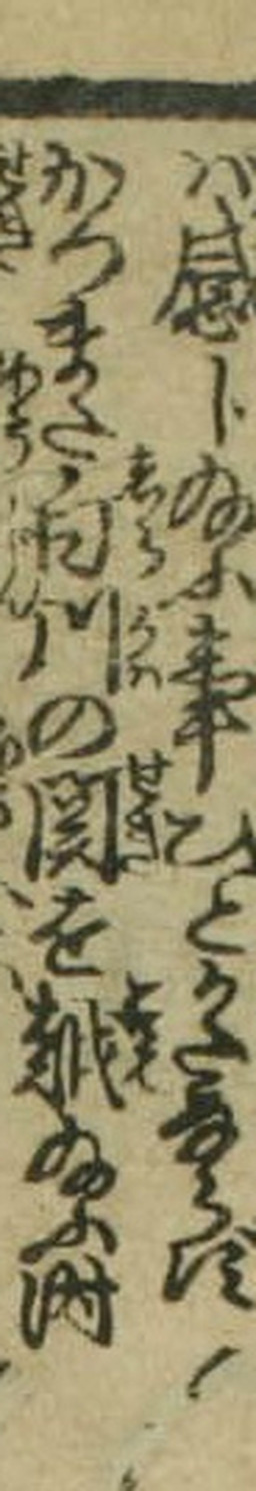かつまた白川の関を越給ふ時
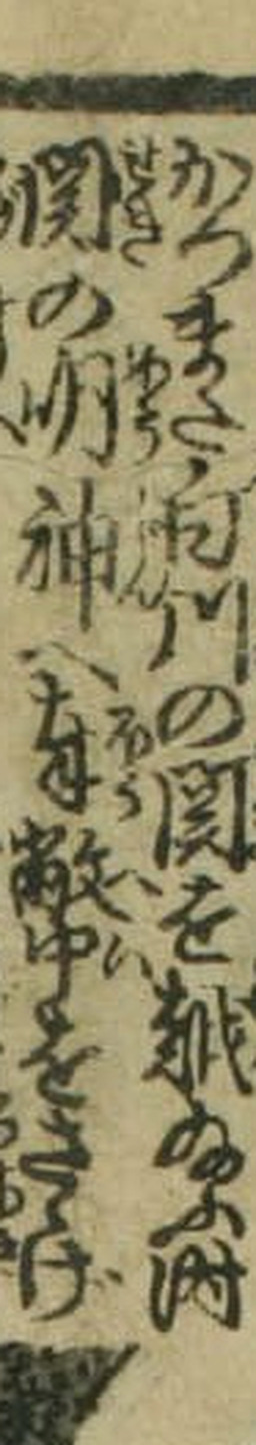関の明神へ奉幣をさゝげ
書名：續英雄百人一首
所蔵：東京学芸大学附属図書館
